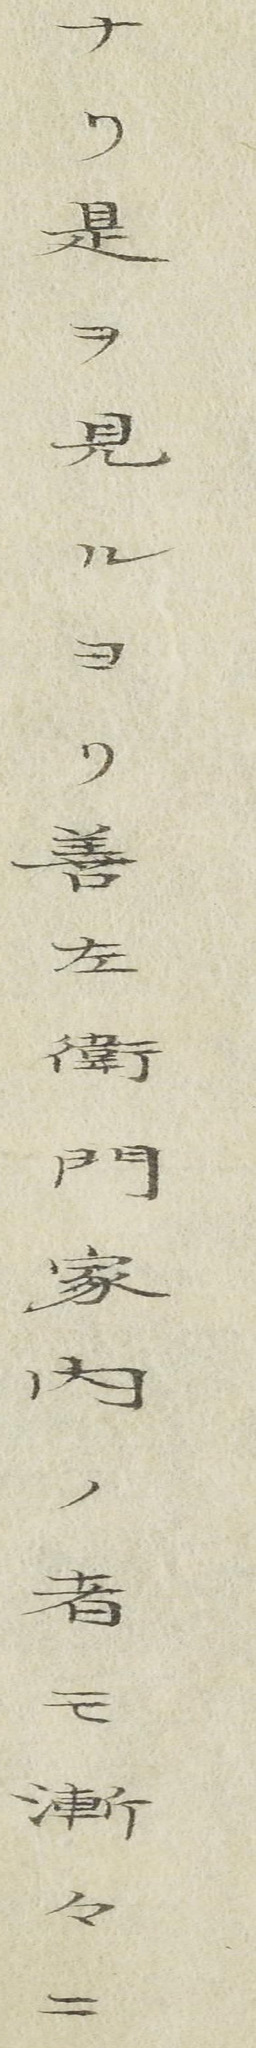ナリ是ヲ見ルヨリ善左衛門家内ノ者モ漸々ニ
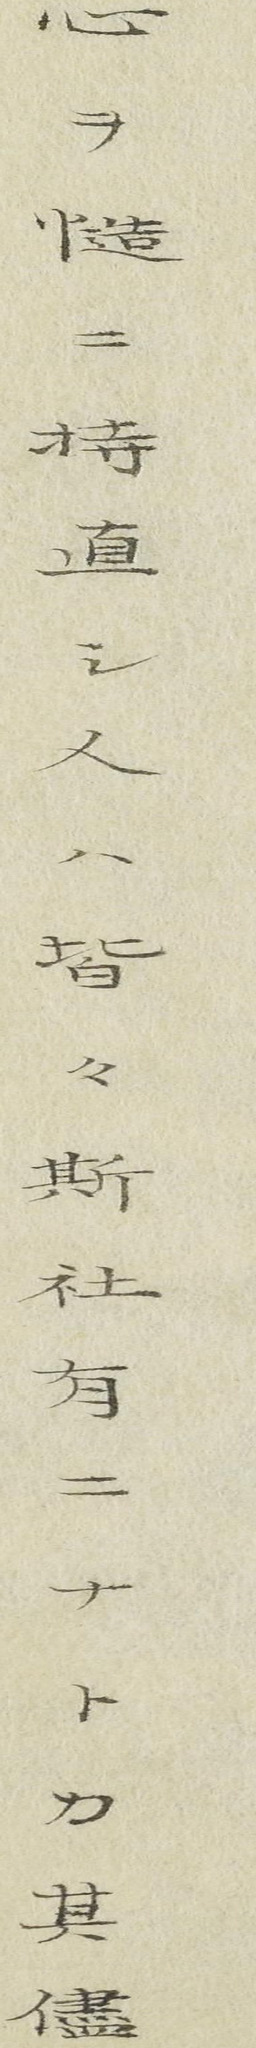心ヲ慥ニ持直シ人ハ皆々斯社有ニナトカ其侭
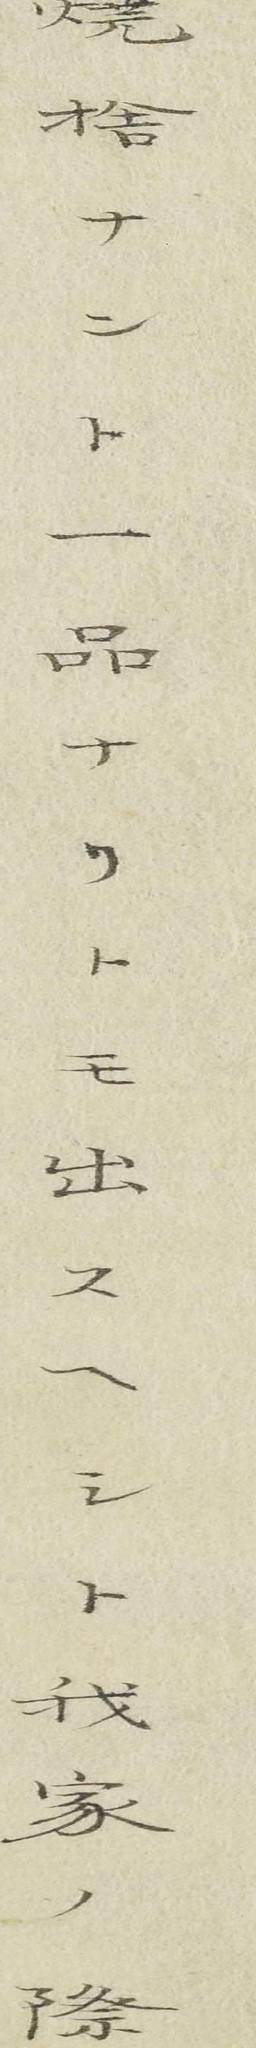焼捨ナント一品ナリトモ出スヘシト我家ノ際

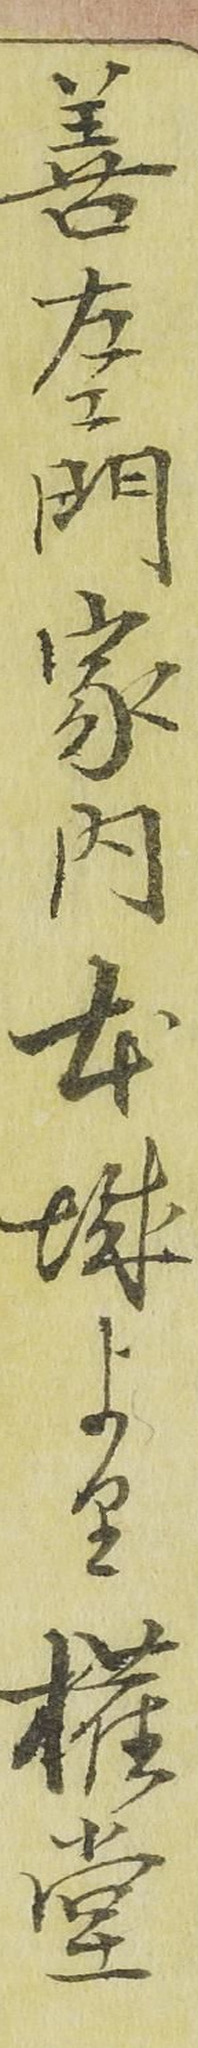善左衛門家内本城より権堂
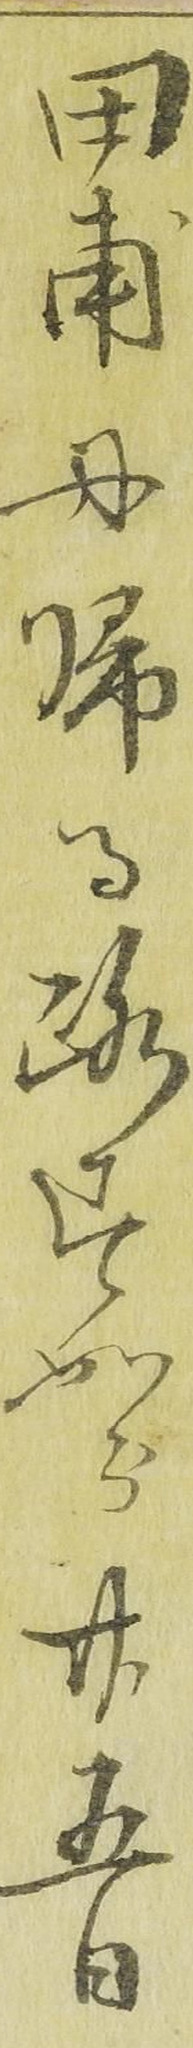田甫に帰る路すから廿五日
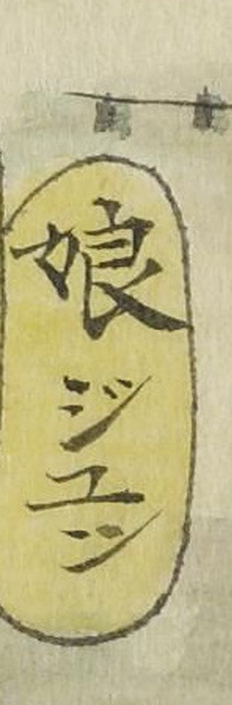娘ジュン
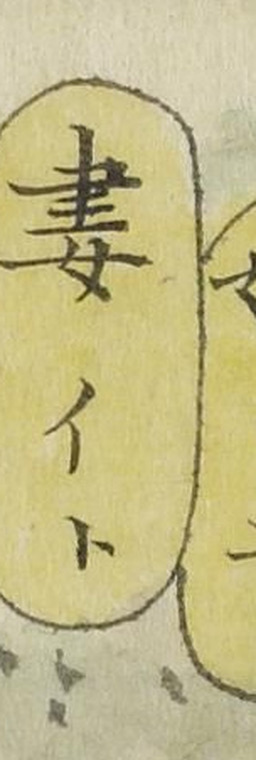妻イト
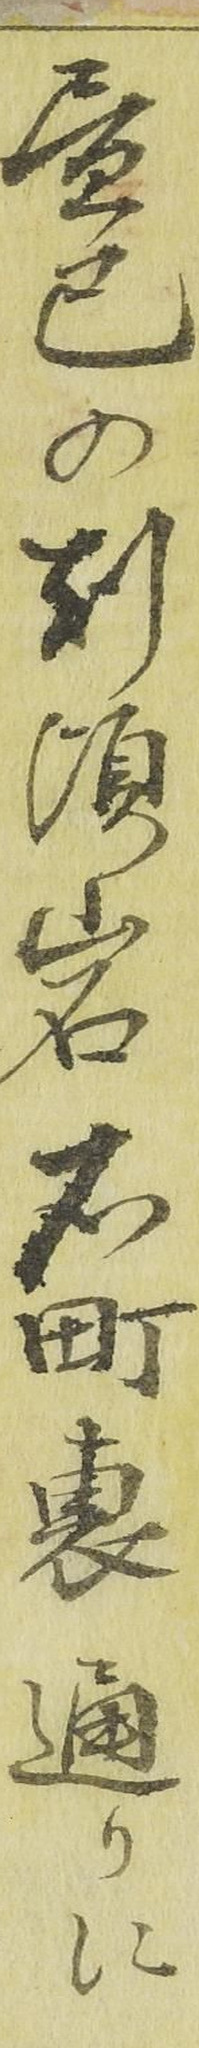昼巳の刻頃岩石町裏通り
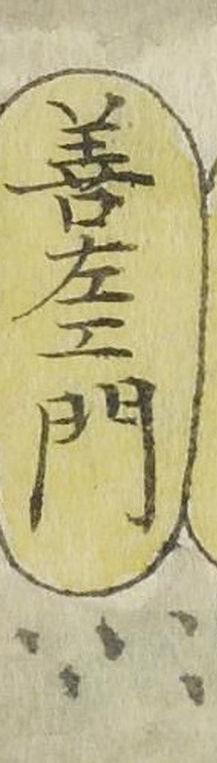善左衛門
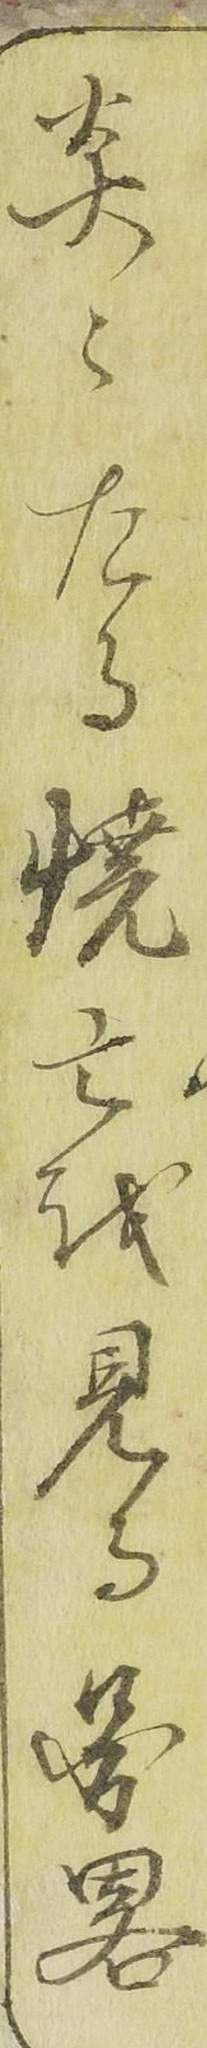炎々なる焼亡を見る図略
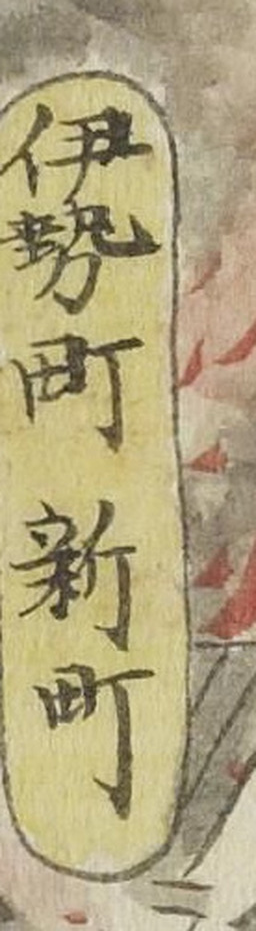伊勢町新町
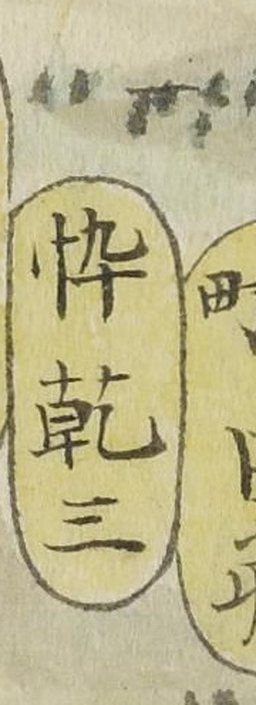忰乾三
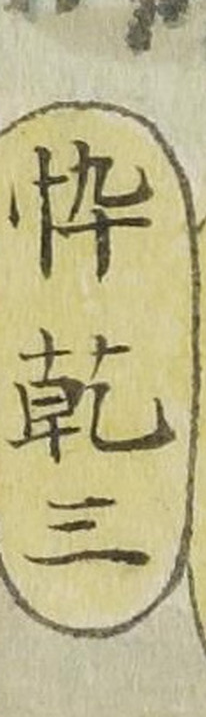忰乾三
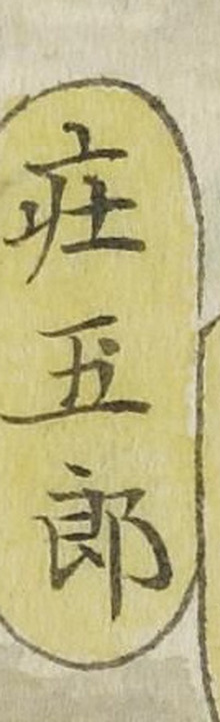庄五郎
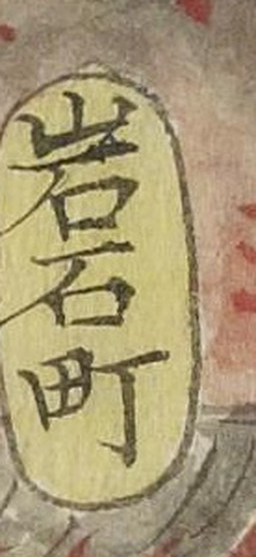岩石町
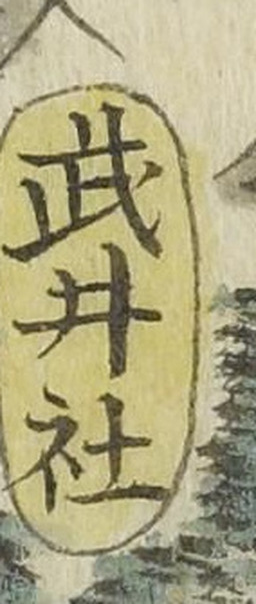武井社
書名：地災撮要　地震之部　巻ノ二
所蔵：東京大学地震研究所図書室 Earthquake Research Institute Library, The University of Tokyo, JAPAN
